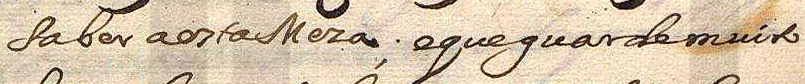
saber a esta Meza; e que guarda muito
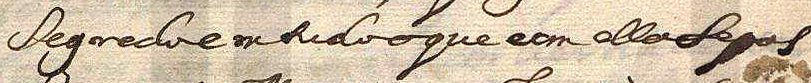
Segredo em tudo o que com ella se pas
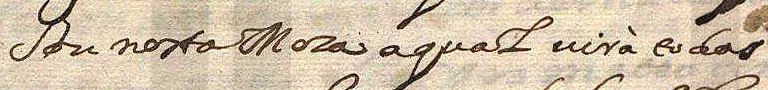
sou nesta Meza a qual uirà todas
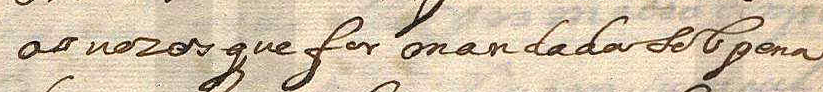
as uezes que for mandada sob pena
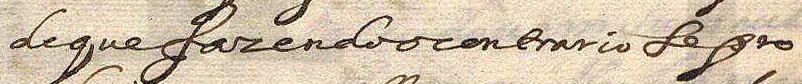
de que fazendo o contrario se pro
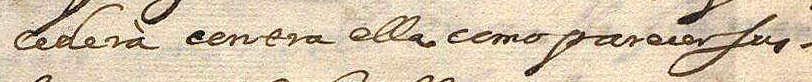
cederà contra ella como parecer Jus
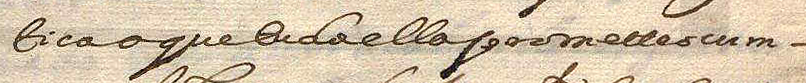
tiça o que tudo ella prometteo cum
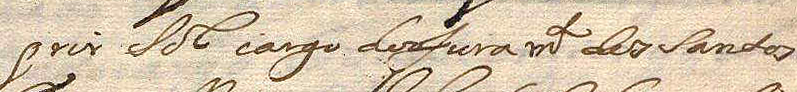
prir sob cargo do Juramto dos Santos
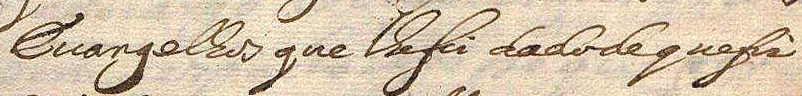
Euangelhos que lhe foi dado de que fiz
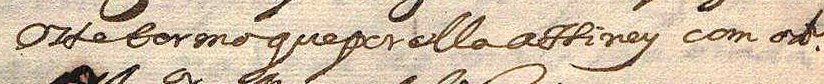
este termo que por ella assiney com o d.o
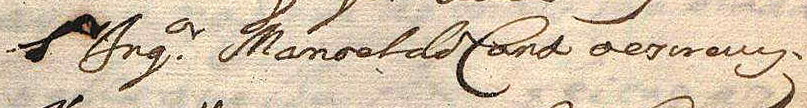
S.or Jnq.or Manoel do Canto o escreui
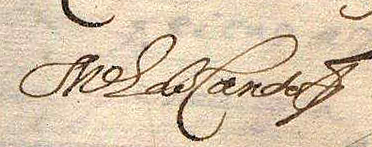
Mel do Canto
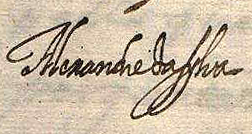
Alexandre da Sylva
